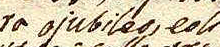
ra o jubileo, e o li
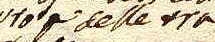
uro q̄ delle tra
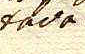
tava.
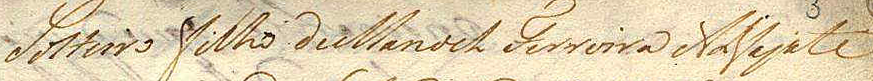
Solteiro filho de Manoel Ferreira Alfajate
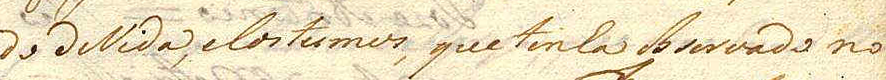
do de Vida, e Costumes, que tenha observado no
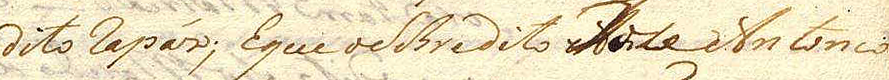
dito Rapáz. E que o Sobredito Ioze Antonio
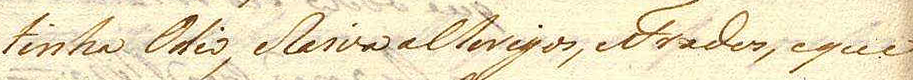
tinha Odio, e Raiva a Clerigos, e Frades, e que
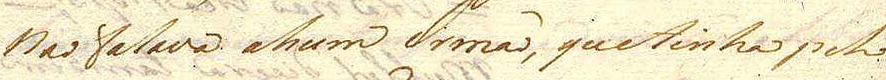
nao falava a hum Irmaõ, que tinha pelo
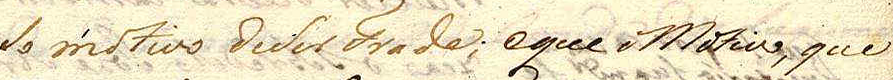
so motivo de ser Frade; e que o Motivo, que
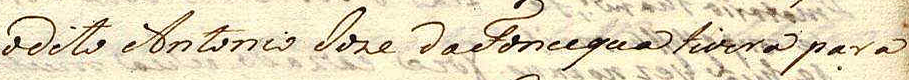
o dito Antonio Ioze da Foncequa tivera para
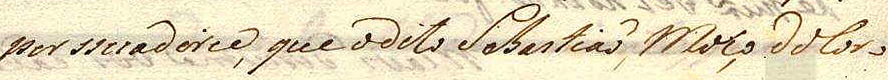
perssuadirce, que o dito Sebastiaõ, Moço do Coro
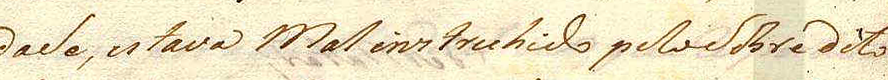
da Se, estava Mal instruhido pelo Sobredito
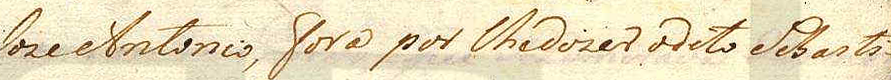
Ioze Antonio, fora por lhe dizer o dito Sebasti
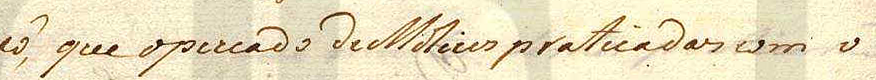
aõ, que o peccado de Molices praticadas com o
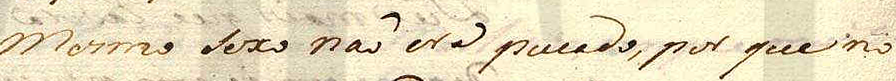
Mesmo sexo naõ era peccado, por que no
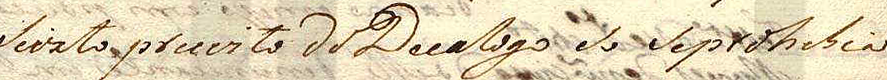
seixto preceito do Decalogo so se prohibia
